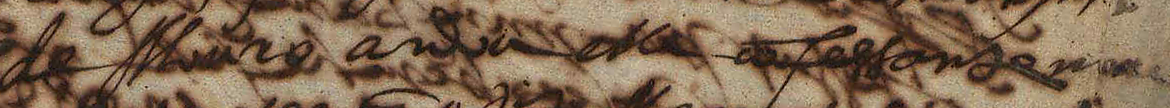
de Mouro andou elle cōfessante noue
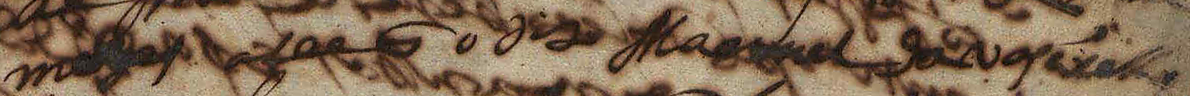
meses atee q̄ o dito Manuel da vascōcellos
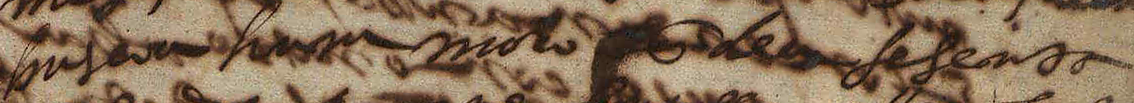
buscou hum moro q̄ deu sesenta
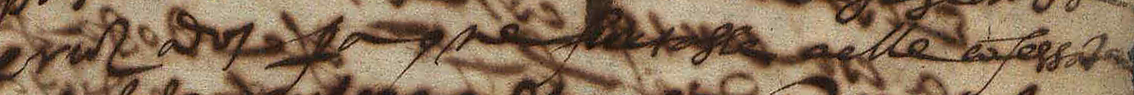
cruzados ꝑa que furtasse a elle cōfessāte
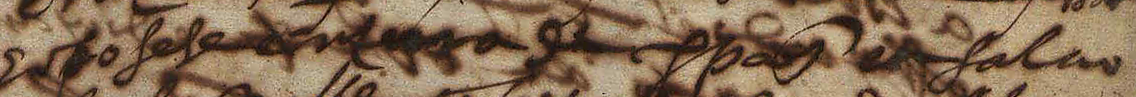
e o posese en terra de xpaõs en saluo
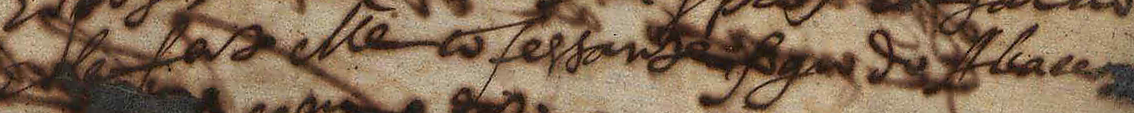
e de fato elle cōfessante fogio do Alcacer
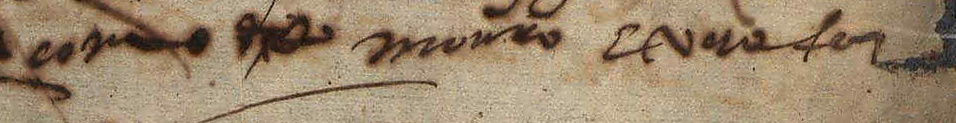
com o dito mouro E vero foj
